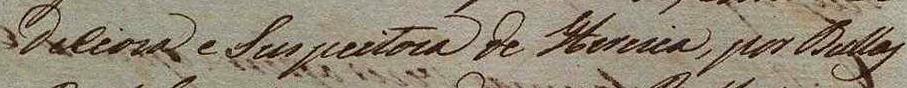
decioza e Suspeitoza de Heresia, por Bullas
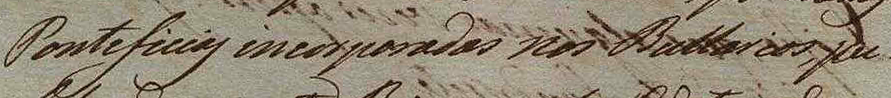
Ponteficias incorporadas nos Bullarios, pu
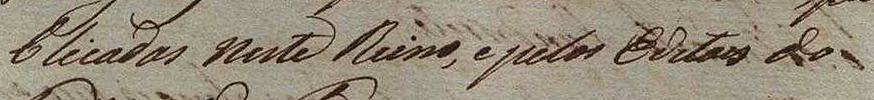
blicadas neste Reino, e pelos Editaes do
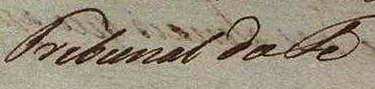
Tribunal da Fe
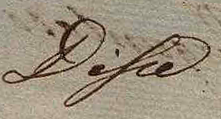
Disse
